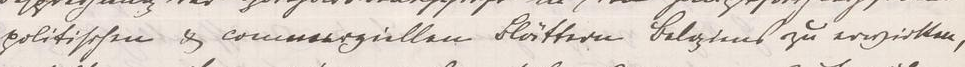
politischen & commerziellen Blättern Belgiens zu erwirken,
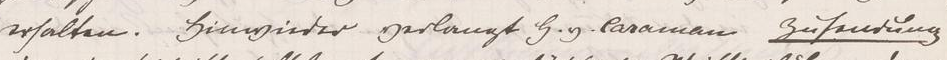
erhalten. Hinwieder verlangt H. v. CaramanZusendung
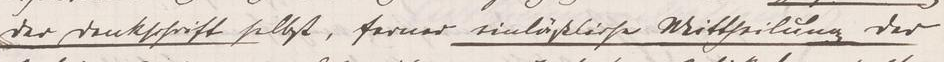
der Denkschrift selbst, ferner einläßliche Mittheilung der
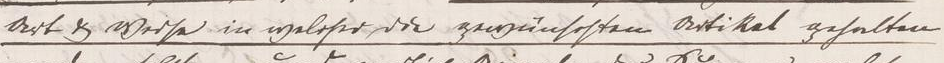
Art & Weise in welcher die gewünschten Artikel gehalten
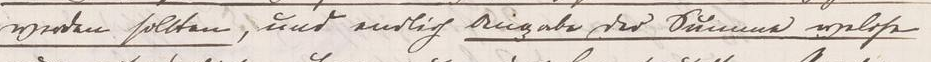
werden sollten, und endlich Angabe der Summe welche
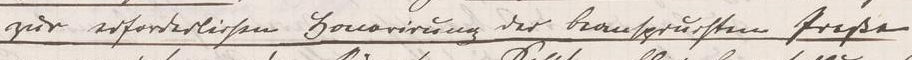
zur erforderlichen Honorirung der beanspruchten Preße
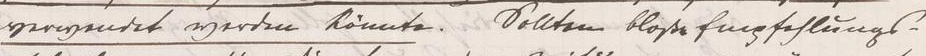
verwendet werden könnte. Sollten bloße Empfehlungs-
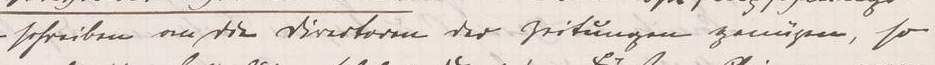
schreiben an die Directoren der Zeitungen genügen, so
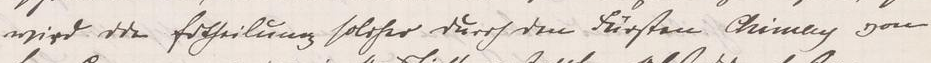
wird die Ertheilung solcher durch den Fürsten Chimay von
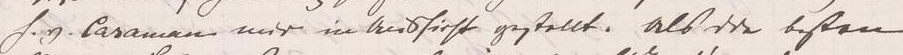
H. v. Caraman mir in Aussicht gestellt. Als die besten
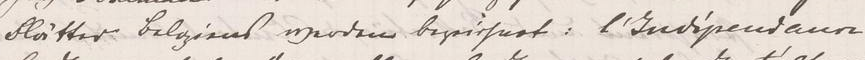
Blätter Belgiens werden bezeichnet: l'Indépendance,
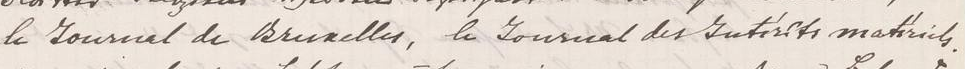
le Journal de Brucelles, le Journal des Intérêts matériels.
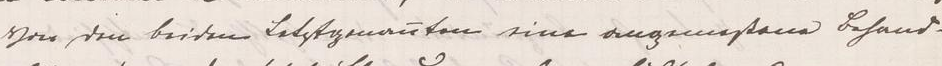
Von den beiden Letztgenannten eine angemeßene Behand-
